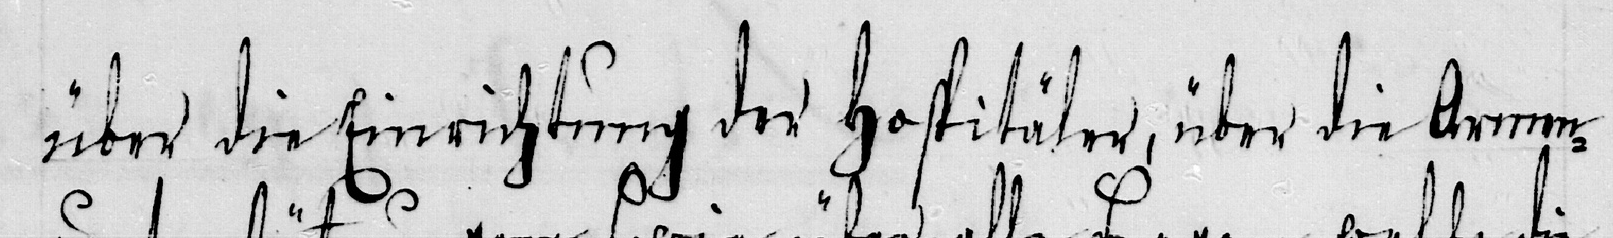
über die Einrichtung der Hospitäler, über die Armen¬
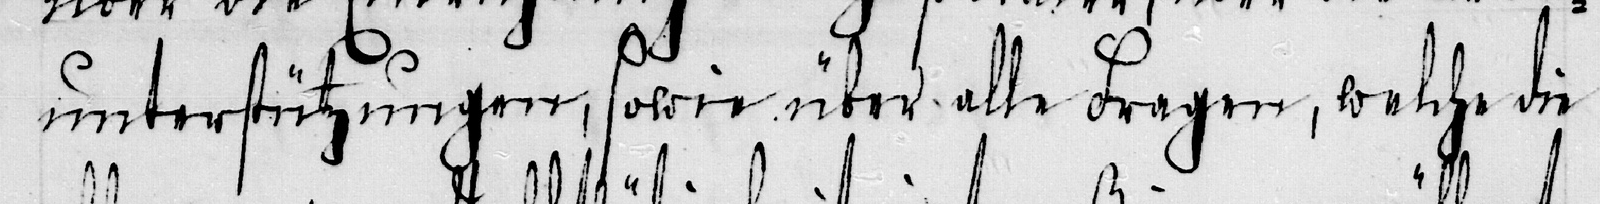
unterstützungen, sowie über alle Fragen, welche die
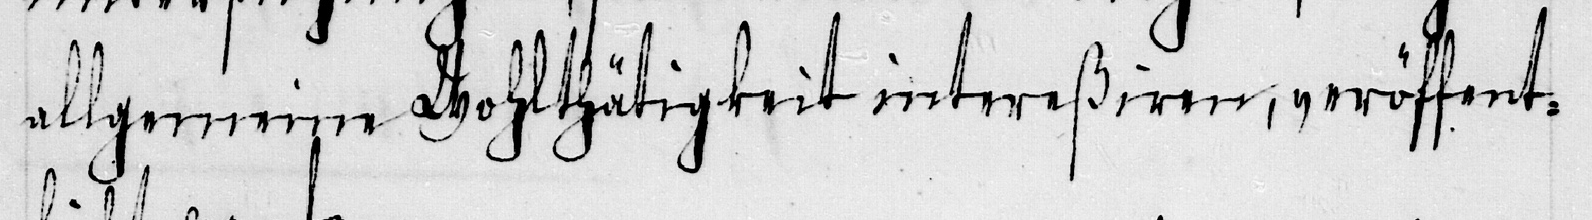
allgemeine Wohltätigkeit intereßiren, veröffent¬
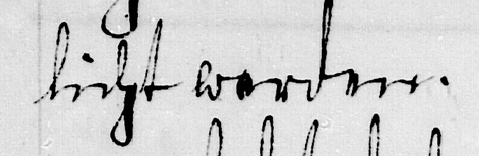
licht werden.
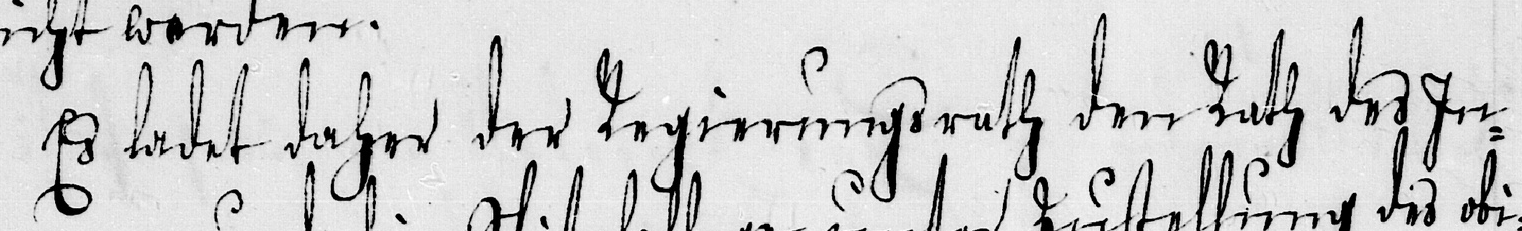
Es ladet daher der Regierungsrath den Rath des In¬
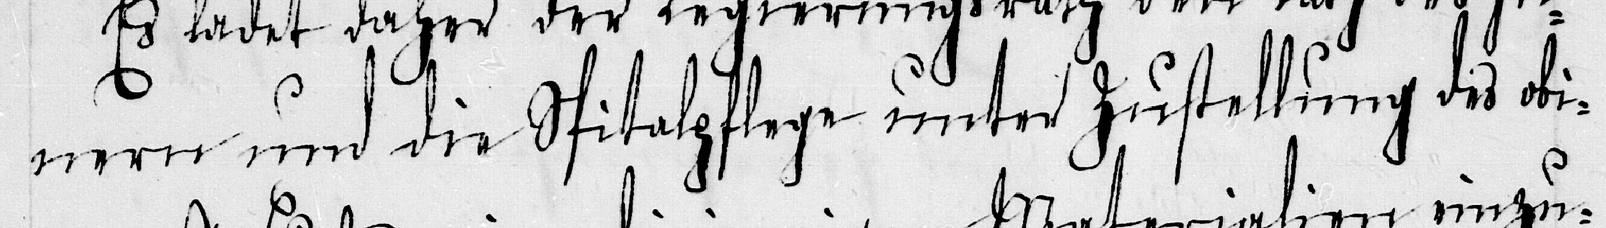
nern und die Spitalpflege unter Zustellung des obi¬
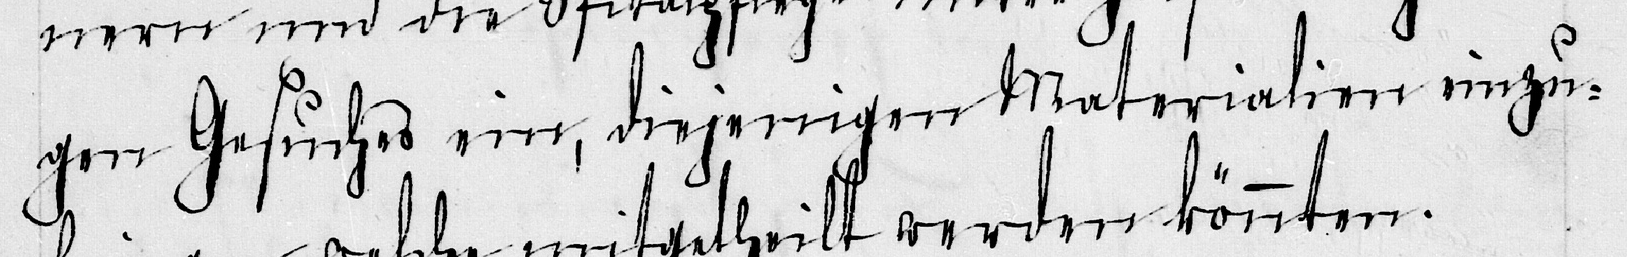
gen Gesuches ein, diejenigen Materialien einzu¬
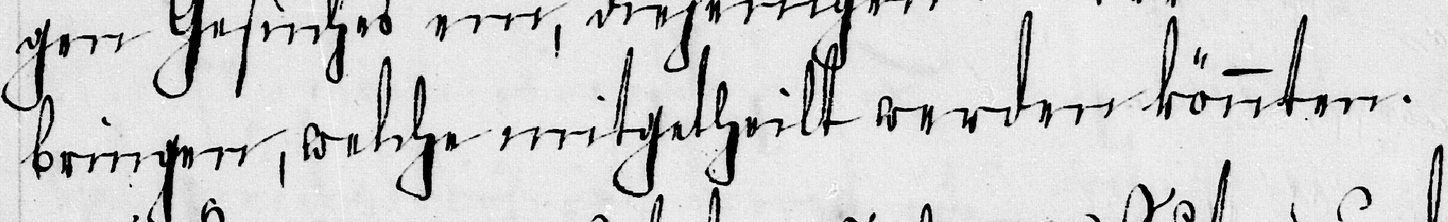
bringen, welche mitgetheilt werden könnten.
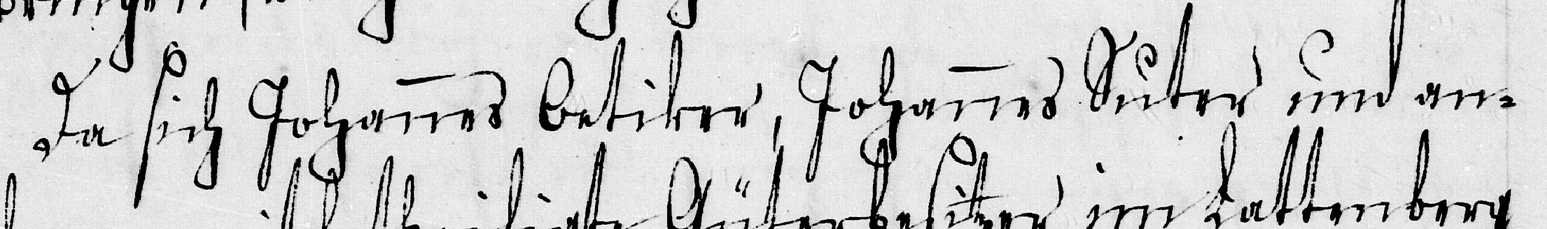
Da sich Johannes Oetiker, Johannes Suter und an¬
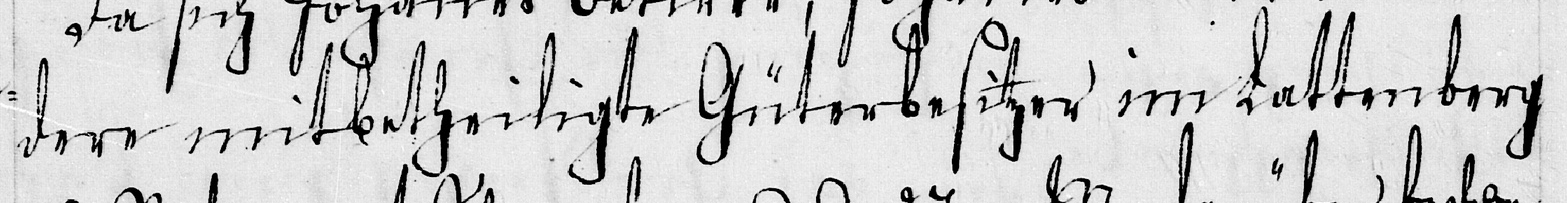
dere mitbetheiligte Güterbesitzer im Lattenberg
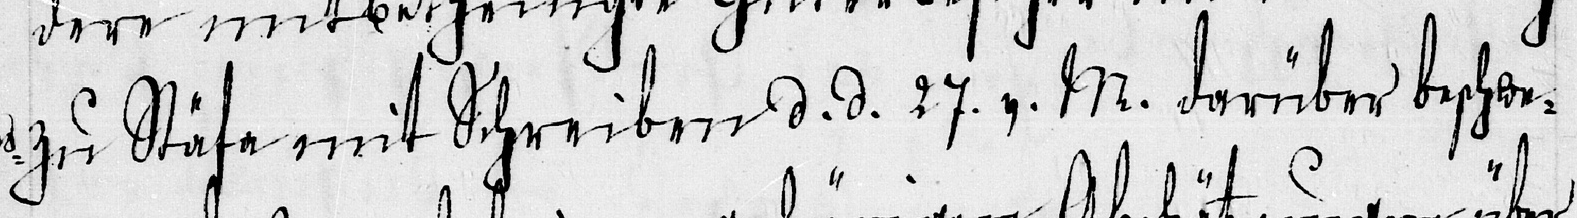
zu Stäfa mit Schreiben d. d. 27. v. M. darüber beschwe¬
